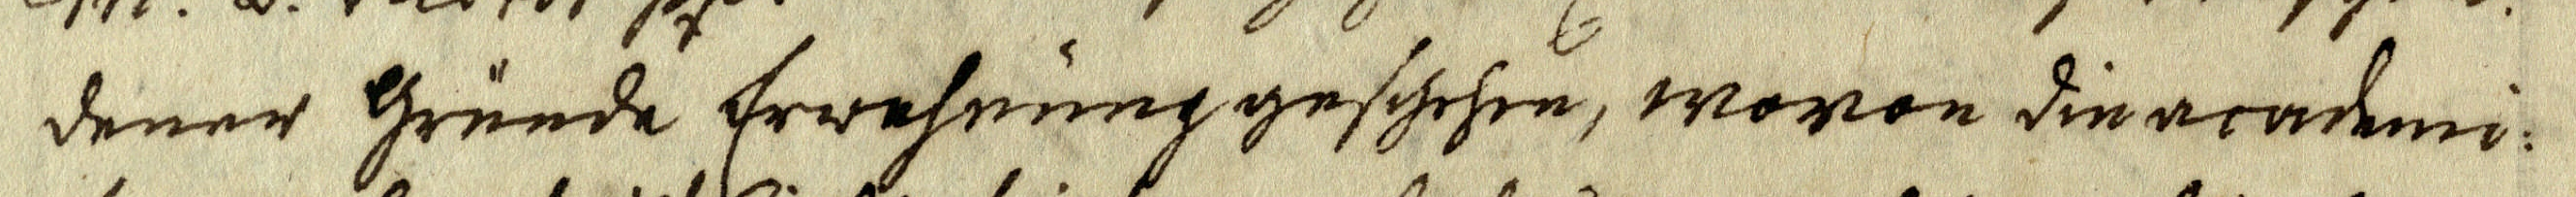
dener Gründe Erwähnung geschehen, wovon die academi¬
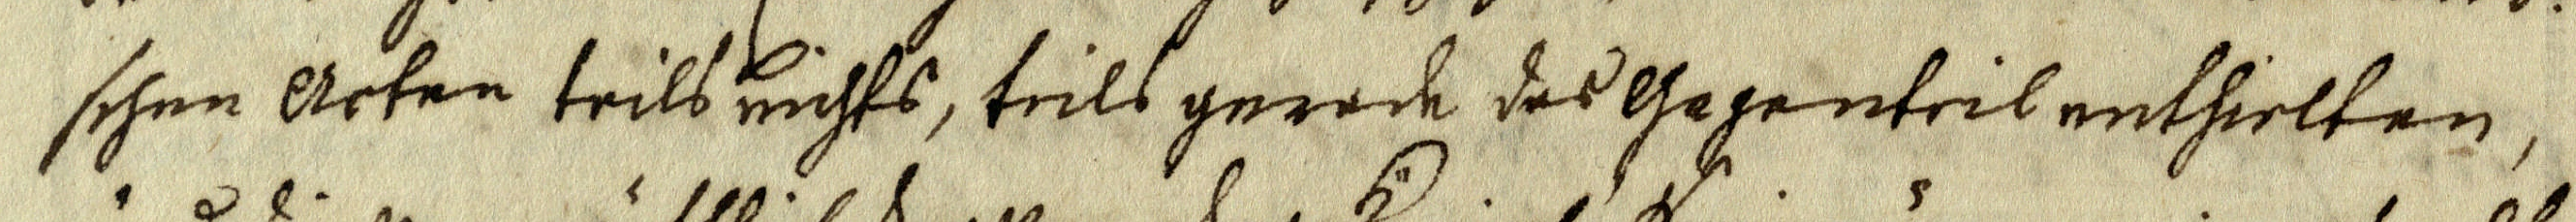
schen Acten teils nichts, teils gerade das Gegenteil enthielten,
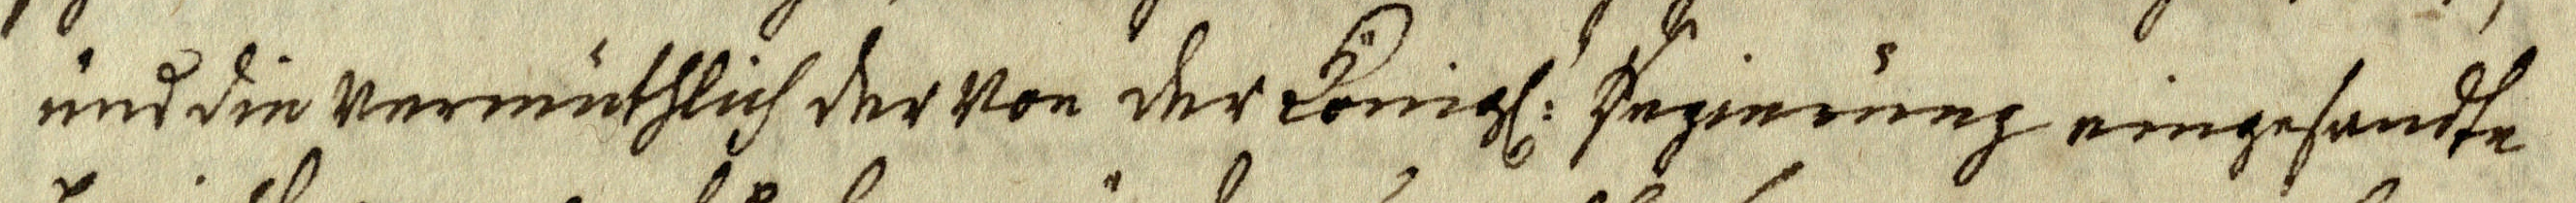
und die vermuthlich der von der Königl. Regierung eingesandte
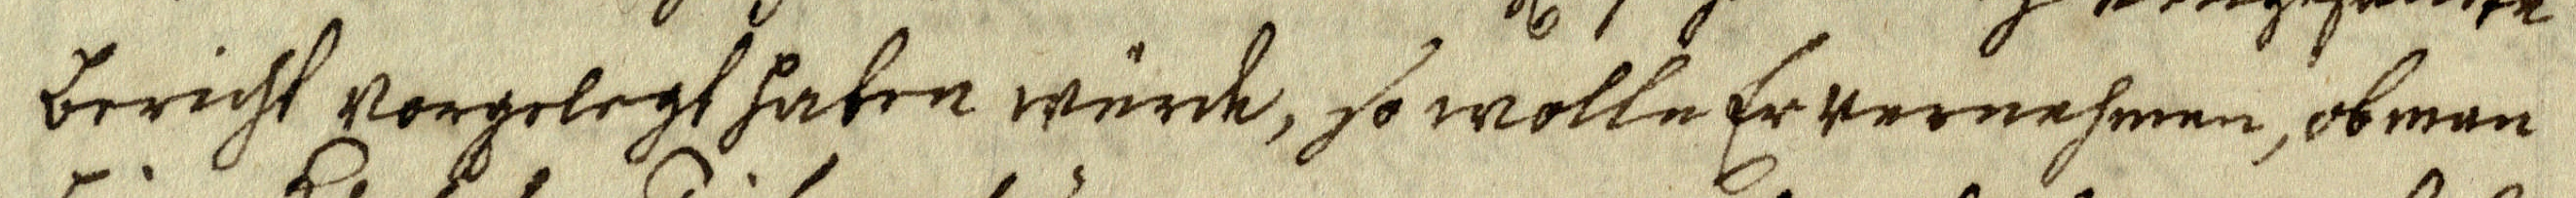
Bericht vorgelegt haben würde, so wolle Er vernehmen, ob man
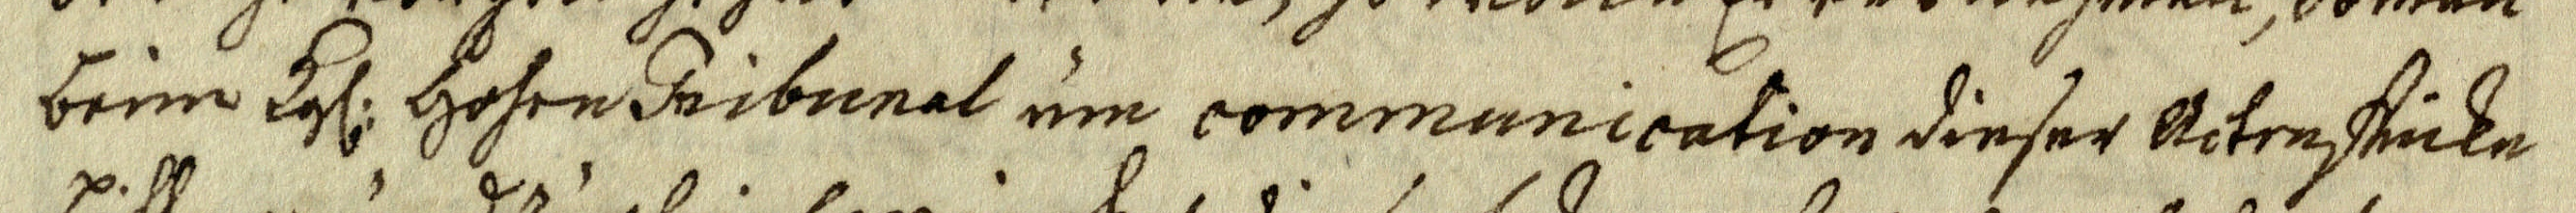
beim Kgl. Hohen Tribunal um communication dieser Actenstücke
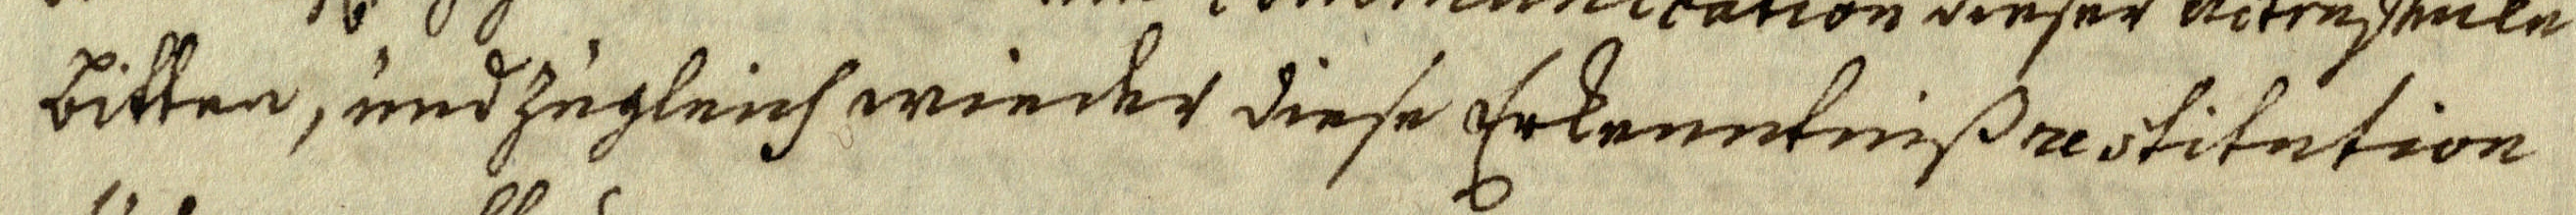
bitten, und zugleich wieder diese Erkenntniß restitution
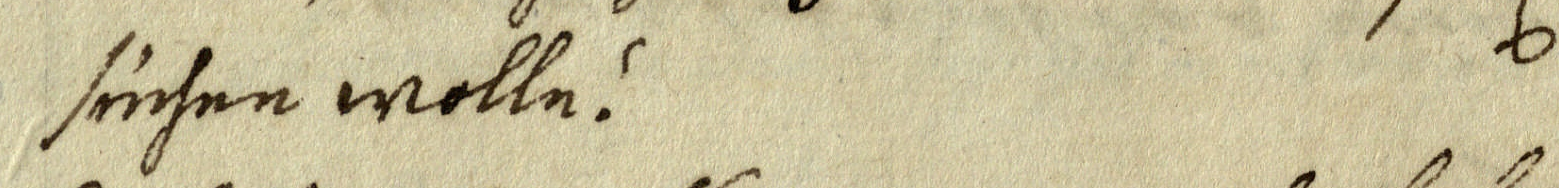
suchen wolle?
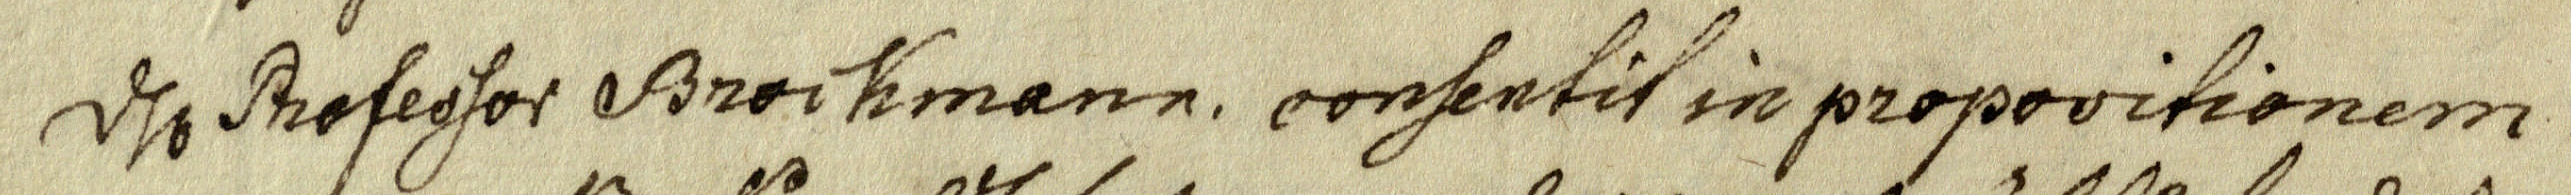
dh Professor Brockmann. consentit in propositionem.
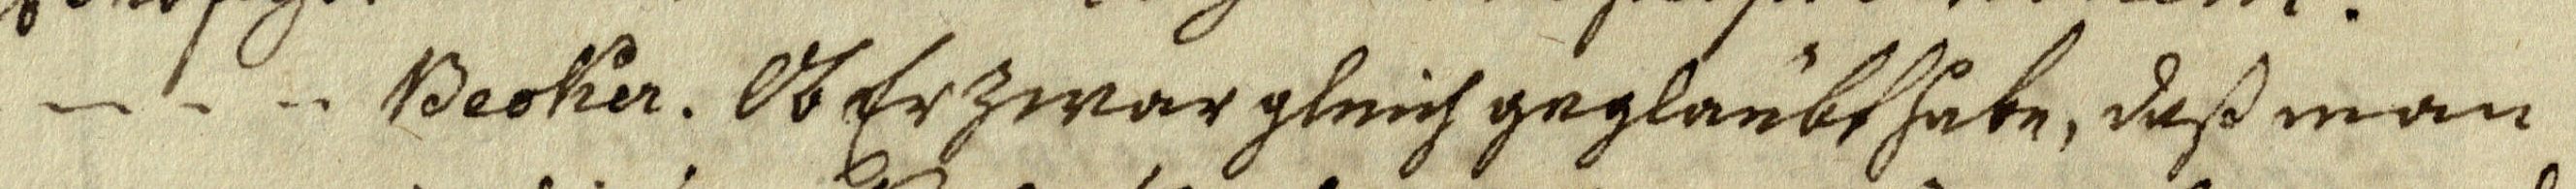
Becker. Ob Er zwar gleich geglaubt habe, daß man
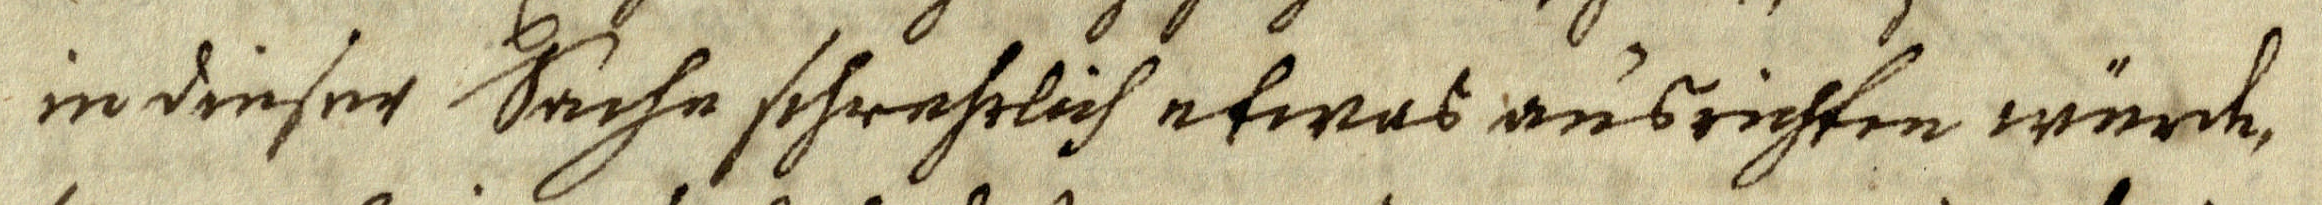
in dieser Sache schwehrlich etwas ausrichten würde,
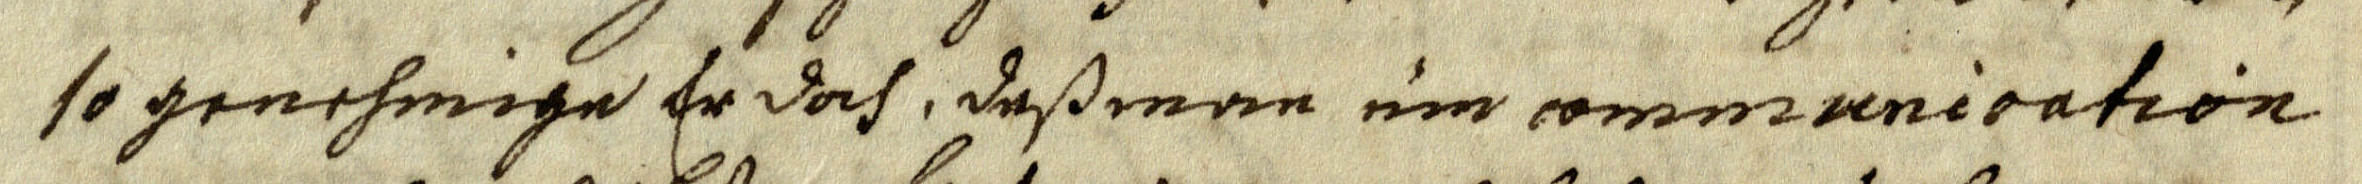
so genehmige Er doch, daß man um communication
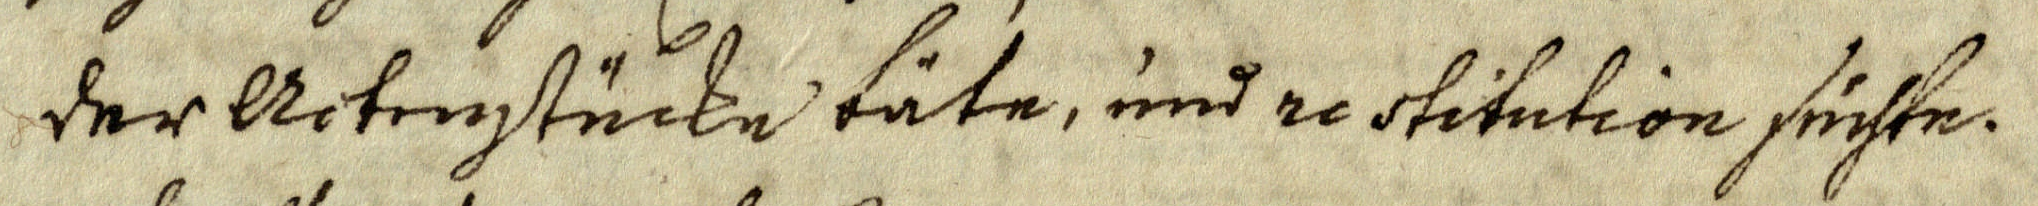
der Actenstücke bäte, und restitution suchte.
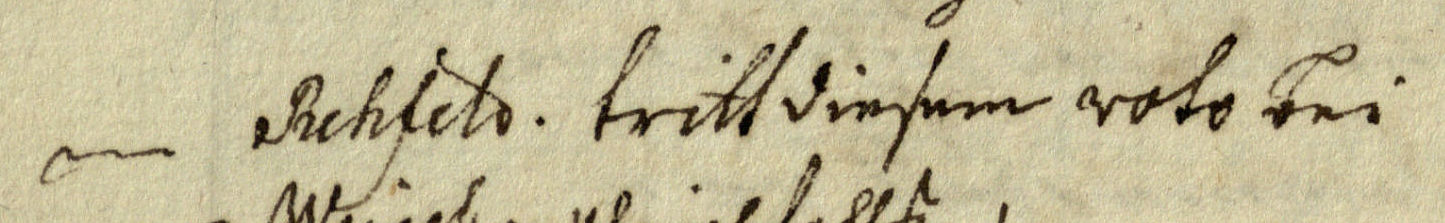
Rehfeld. tritt diesem voto bei.
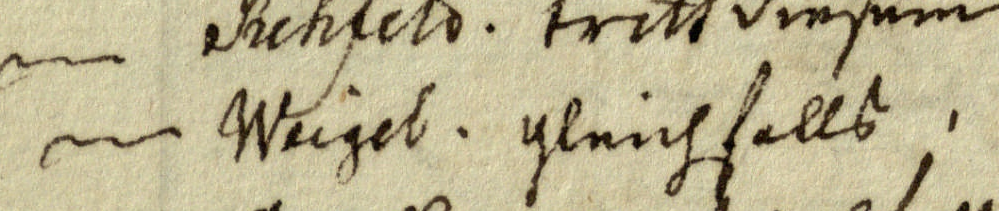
Weigel gleichfalls.
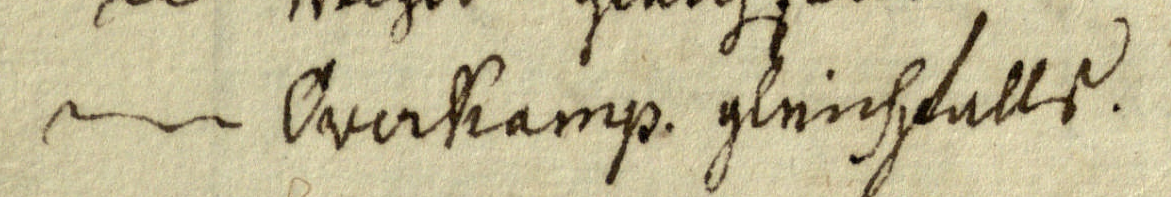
Overkamp gleichfalls.
